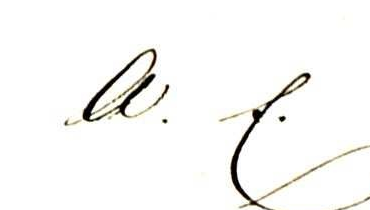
A. E.
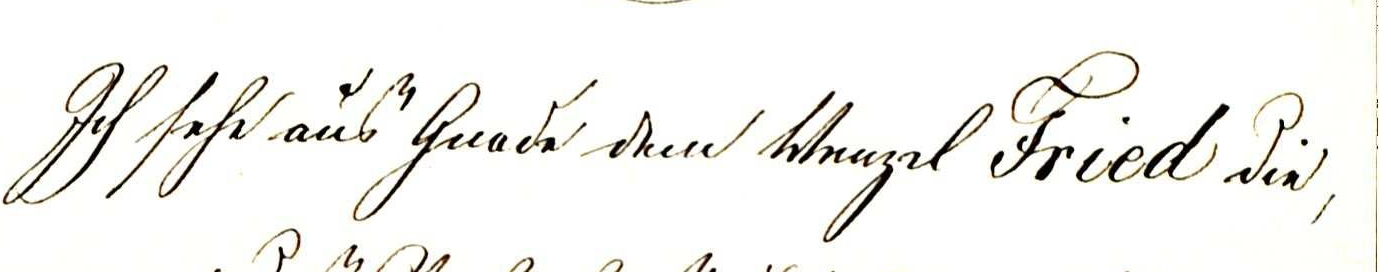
Ich sehe aus Gnade dem Wenzel Fried die,
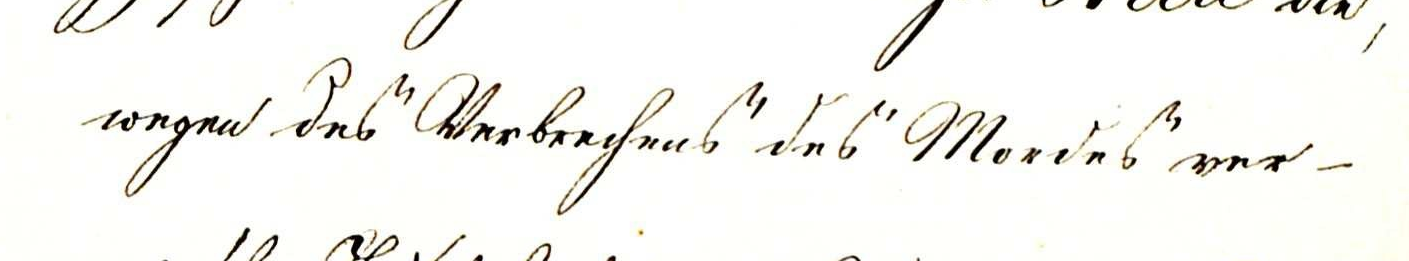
wegen des Verbrechens des Mordes ver¬
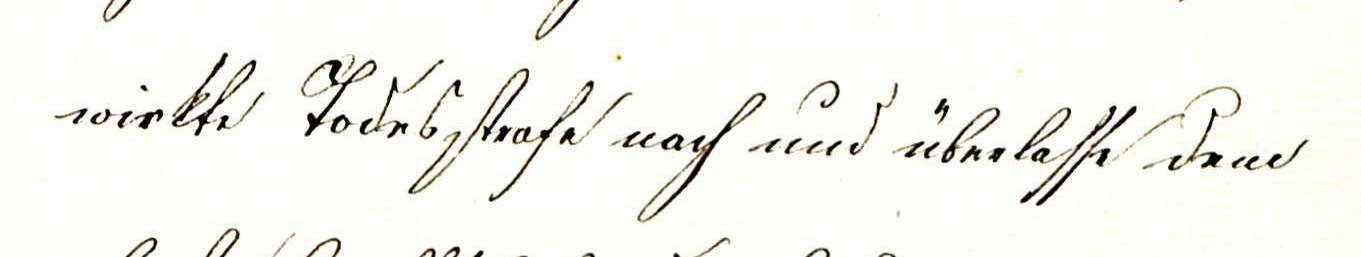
wirkte Todesstrafe nach und überlasse dem
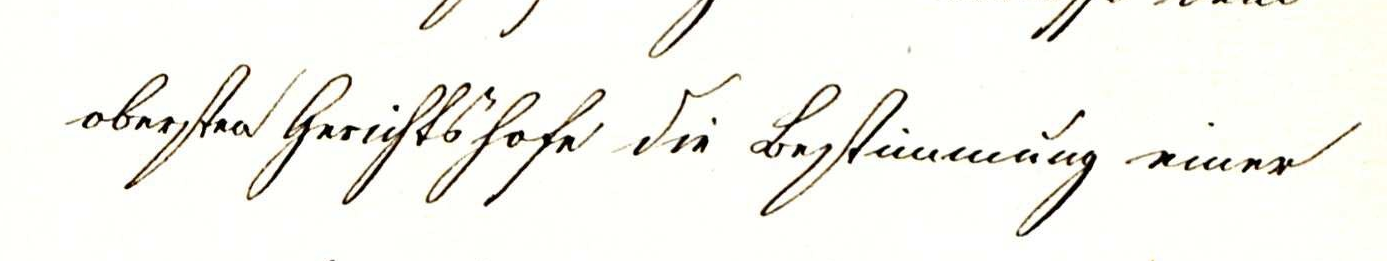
obersten Gerichtshofe die Bestimmung einer
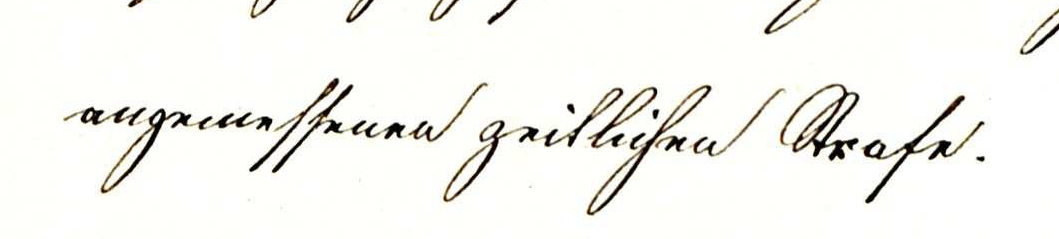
angemessenen zeitlichen Strafe.
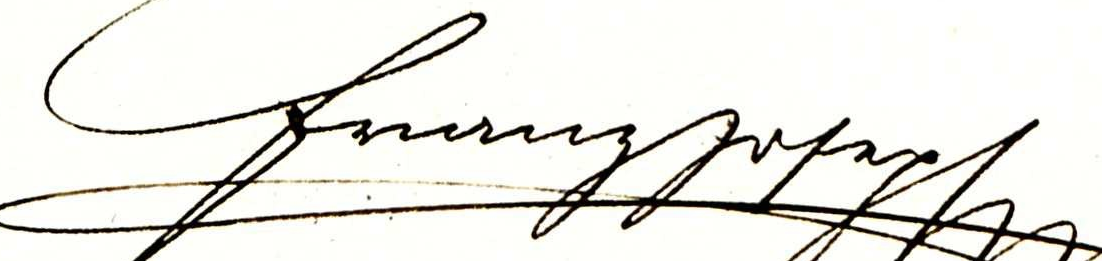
Franz Joseph
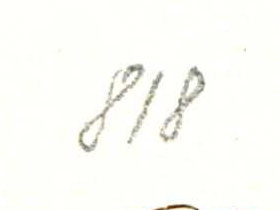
818
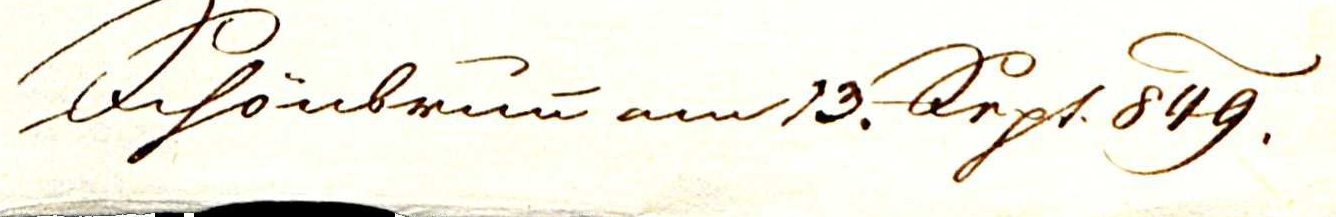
Schönbrunn am 13. Sept. 849
